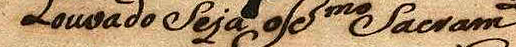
Louvado seja o Ssmo Sacramto
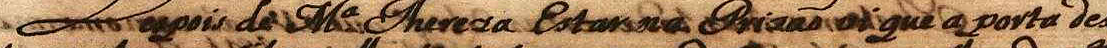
Despois de M.a Thereza Estar na Prizaõ vi que a porta des
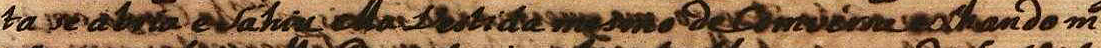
ta se abria e sahia ella Vestida mesmo de Comve_ olhando m.to
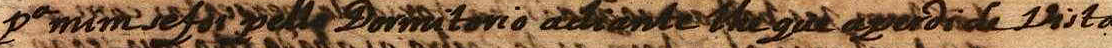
pa mim se foi pello Dormitorio adiante the que a perdi de Vista
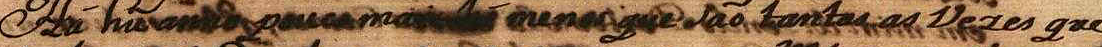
Há hū anno pouco mais hō menos que saõ tantas as Vezes que
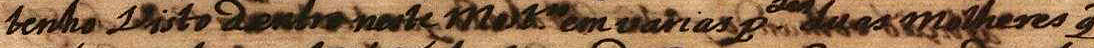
tenho Visto dentro neste Most.ro em uarias p.tes duas mulheres q̄
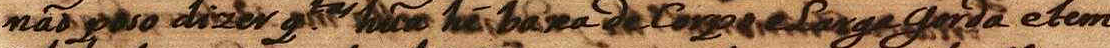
não poso dizer q.tas hūa hé baxa de Corpo e Larga Gorda e tem
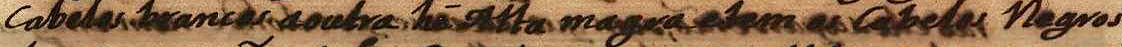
Cabelos brancos a outra hé Alta magra e tem os Cabelos Negros
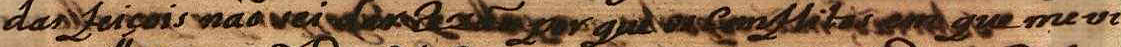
das feiçois naõ sei dar Rezão porque os Comflitos em que me vi
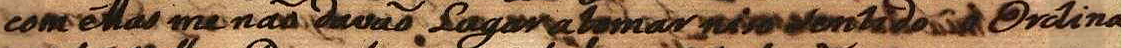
com éllas me não davão Lugar a tomar niso sentido Ordina
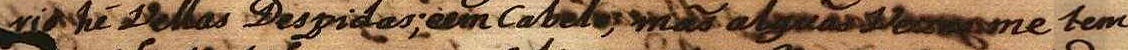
rio hé Vellas Despidas; e em Cabelo; mãs algūas Vezes me tem
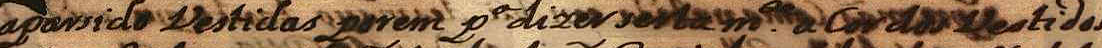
aparsido Vestidas porem pa dizer sertam.te aCordas Vestidos
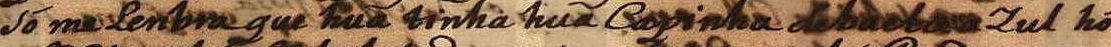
Só me Lembra que huā tinha huā Capinha de baeta aZul hó
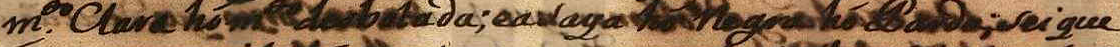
m.to Clara hó m.to desbotada; e a saya hó Negra hó Parda; sei que
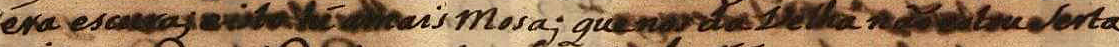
éra escura, e isto hé a mais mosa; que nas da Velha naõ estou serta
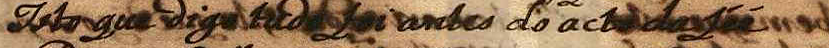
Isto que digo tudo foi antes do acto da féé
